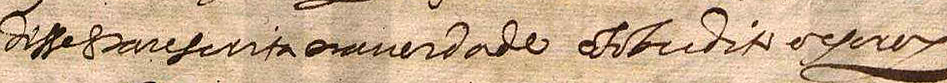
disse estar escrita na uerdade o sobredito o escreuj
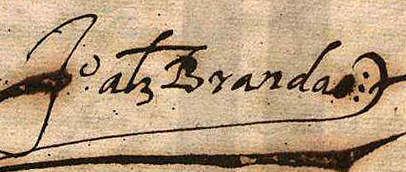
J.o al̄z Brandaõ
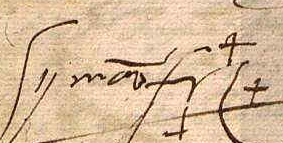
Sijmão frz
